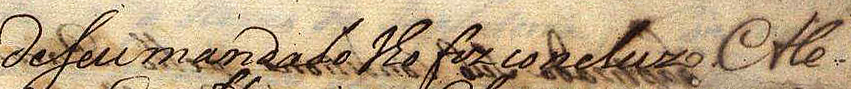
de seu mandado lhe fez concluzo Ale
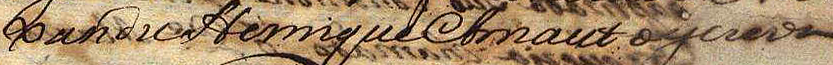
xandre Henrique Arnaut o escrevi
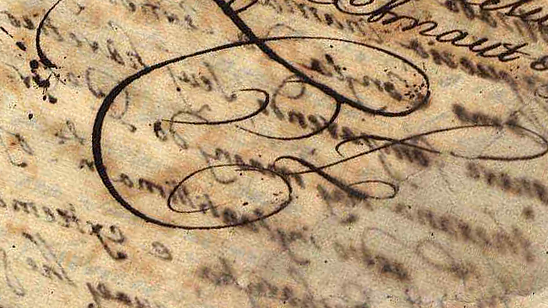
CLo
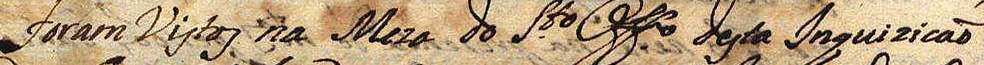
Foram Vistos na Meza do S.to Off.o desta Inquiziçaõ
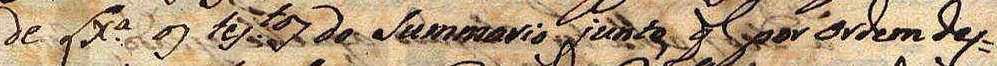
de Lx.a os tes.tos do summario junto, q̄ por ordem des
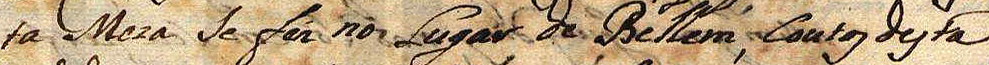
ta Meza se fez no Lugar de Bellem, Coutos desta
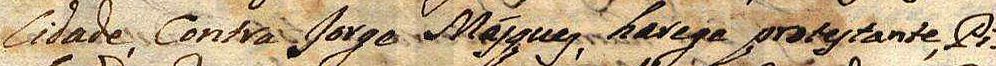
Cidade, Contra Jorge Masques, harege protestante, Pi
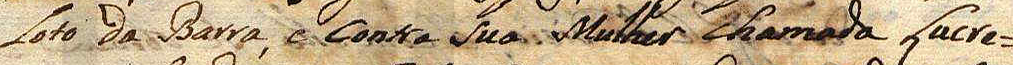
Loto da Barra, e Contra sua Mulher chamada Lucre
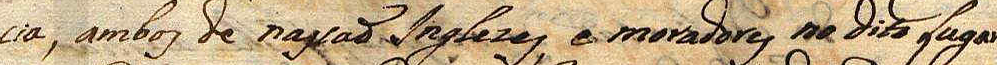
cia, ambos de nascaõ Inglezes, e moradores no dito Lugar,
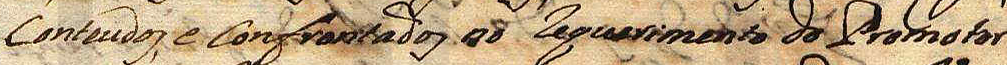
Conteudos, e Confrontados no Requerimento do Promotor
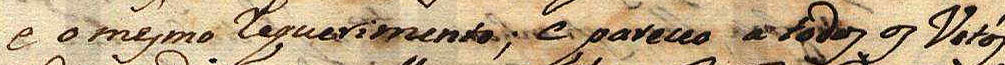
e o mesmo Requerimento; e pareceo a todos os Votós
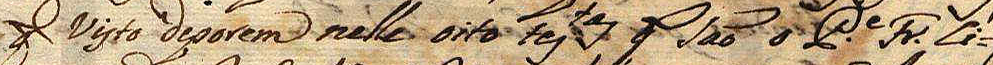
q̄ visto deporem nelle oito tes.tas q̄ saõ o P.e Fr. ci
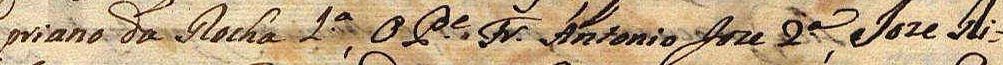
priano da Rocha 1.a, O P.e Fr. Antonio Joze 2.a, Joze Ri
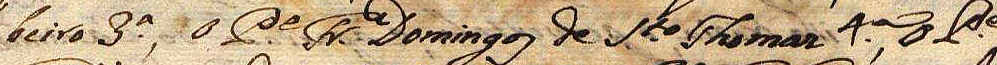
beiro 3.a, o P.e Fr. Domingos de s.to Thomaz 4.a, o P.e
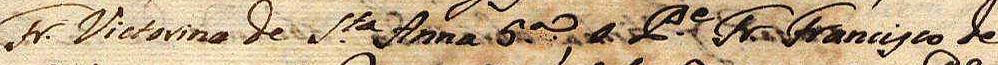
Fr. Victorino de s.ta Anna 5.a, o P.e Fr. Francisco de
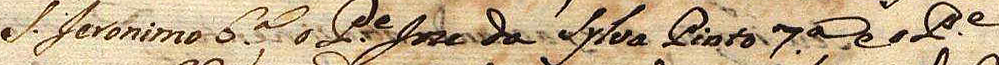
S. Jeronimo 6.a, o P.e Joze da Sylva Pinto 7a, e o P.e
